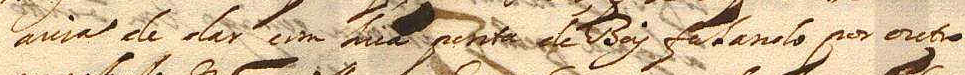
auia de dar com huā ponta de Boy falando por outro
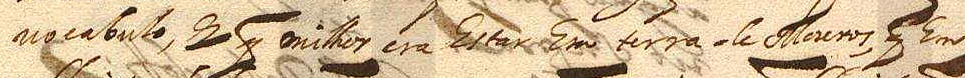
uocabulo, E q̄ milhor era Estar Em terra de Mouros, q̄ Em
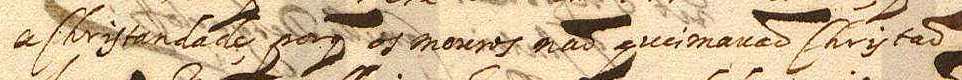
a Christandade, porq̄ os mouros não queimauão Christaõ
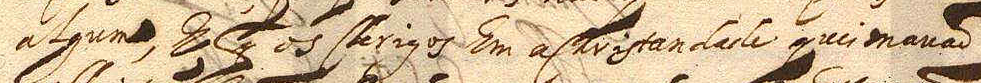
algum, E q̄ os Clerigos Em a Christandade queimauaõ
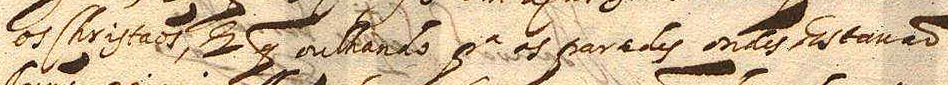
os Christaõs, E q̄ oulhando p.a as paredes onde Estauaõ
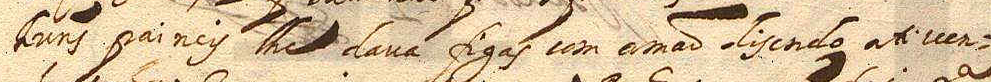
huns paineis lhe daua figas com a maõ disendo a ti uen
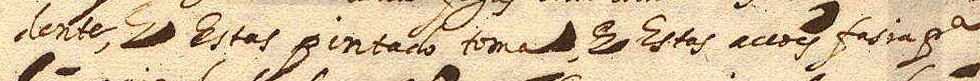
dente, E Estas pintado toma, E Estas acçoẽs fasia pa
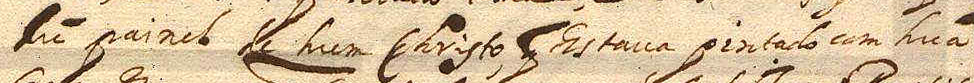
hū painel de hum Christo, q̄ Estaua pintado com huā
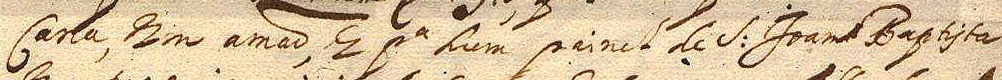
Cana, Em a maõ, E pa hum painel de S. Joam Baptista
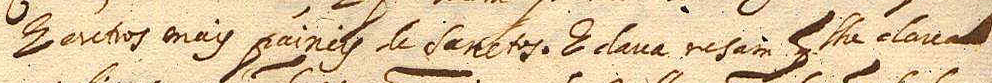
E outros mais paineis de sanctos. E daua resam q̄ lhe daua
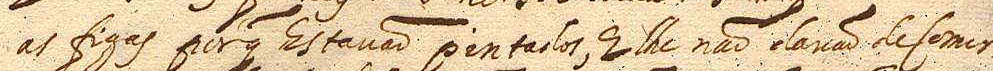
as figas, porq̄ Estauaõ pintados, E lhe naõ dauaõ de Comer
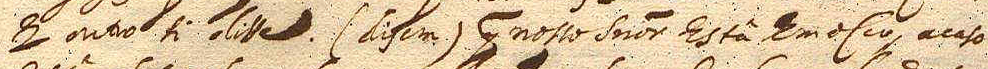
E outrosi disse (disem) q̄ nosso snor̄ Estâ Em o Ceo, acaso
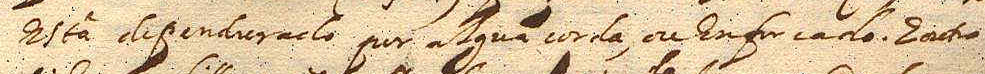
Estâ dependurado por alguā corda, ou Enforcado. E outro
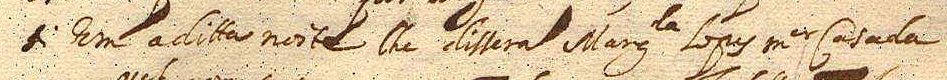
si Em a ditta noite lhe dissera Margda Lopes mer Casada
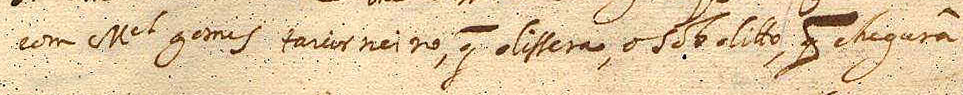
com M.el gomes taverneiro, q̄ dissera, o sobditto, q̄ chegara
